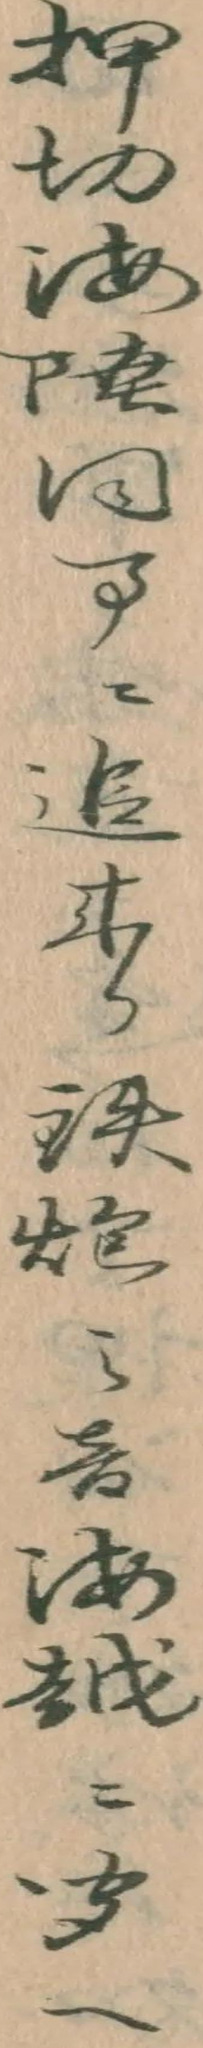押切海陸同事に追来り鉄炮之音海越に聞へ
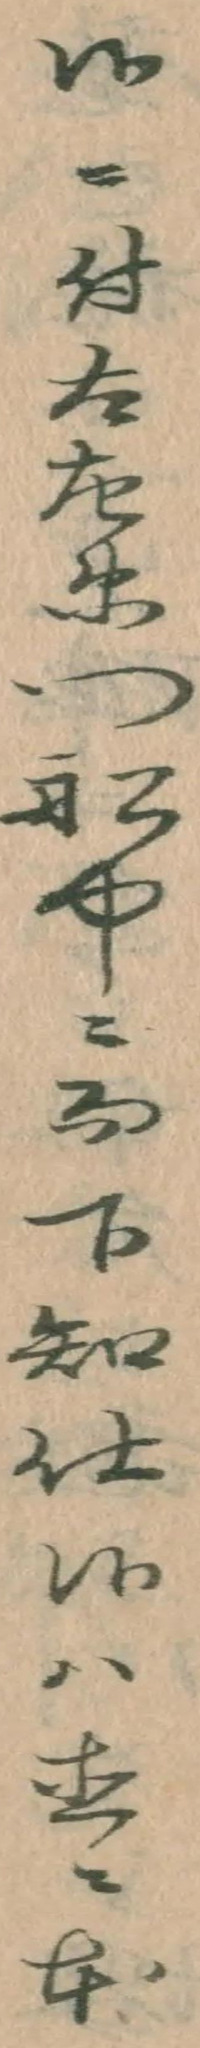候に付太左衛門舩中に而下知仕候は直に本
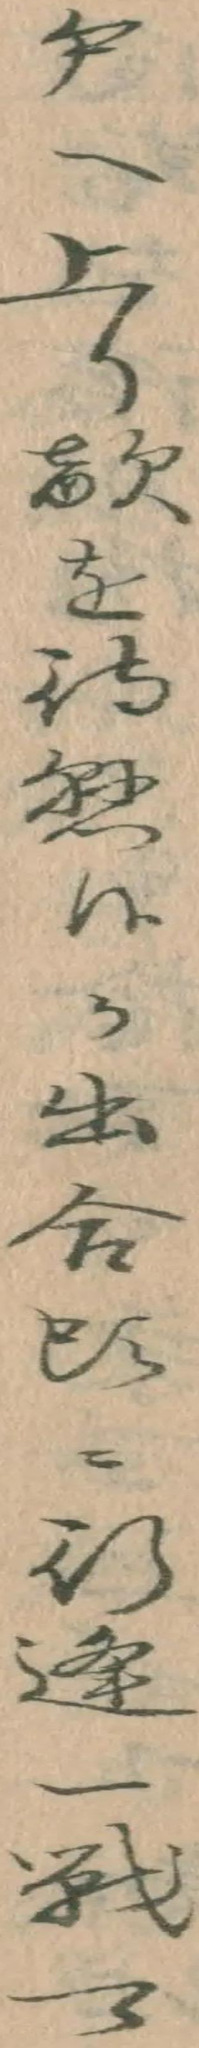戸へ上り敵を待懸候か出合頭に行逢一戦可
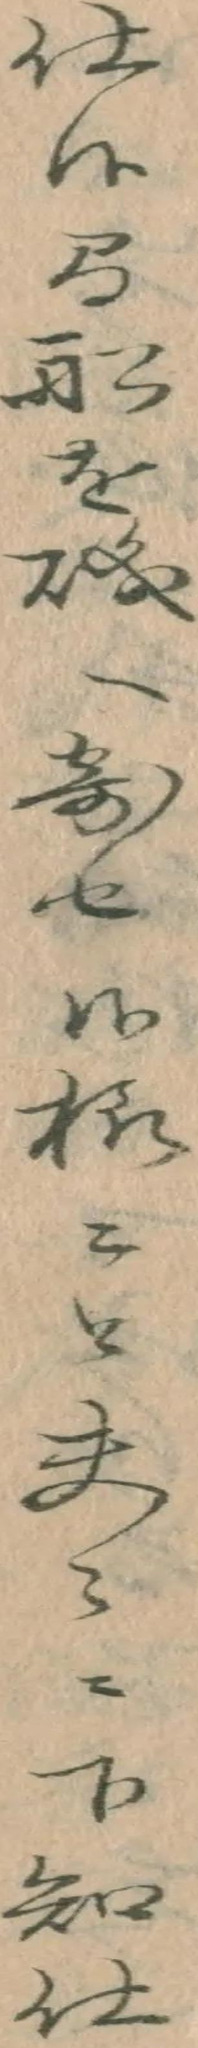仕候間舩を磯へ寄せ候様にと夫々に下知仕
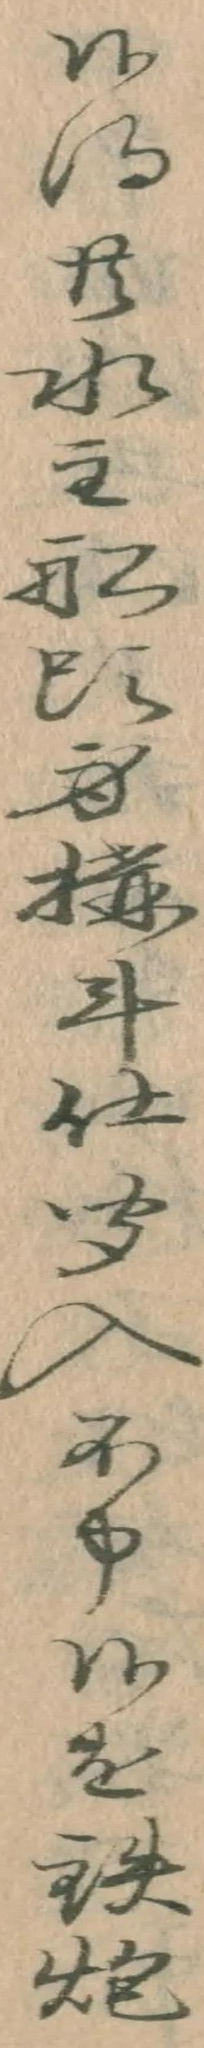候得共水主舩頭身構斗仕聞入不申候を鉄炮
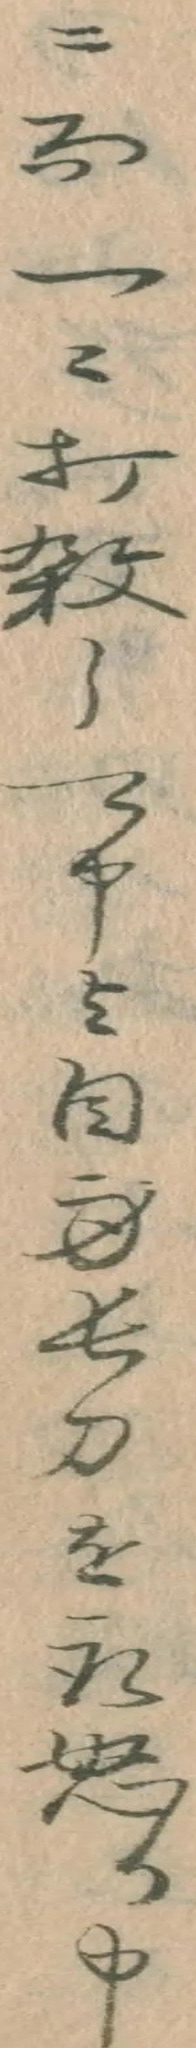に而一々打殺し可申与自身長刀を取怒り申
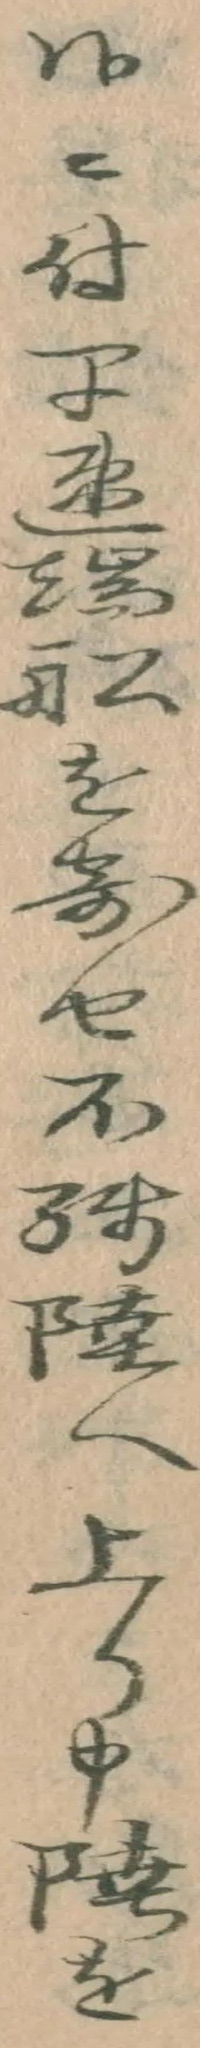候に付早速端舩を寄せ不残陸へ上り申陸を
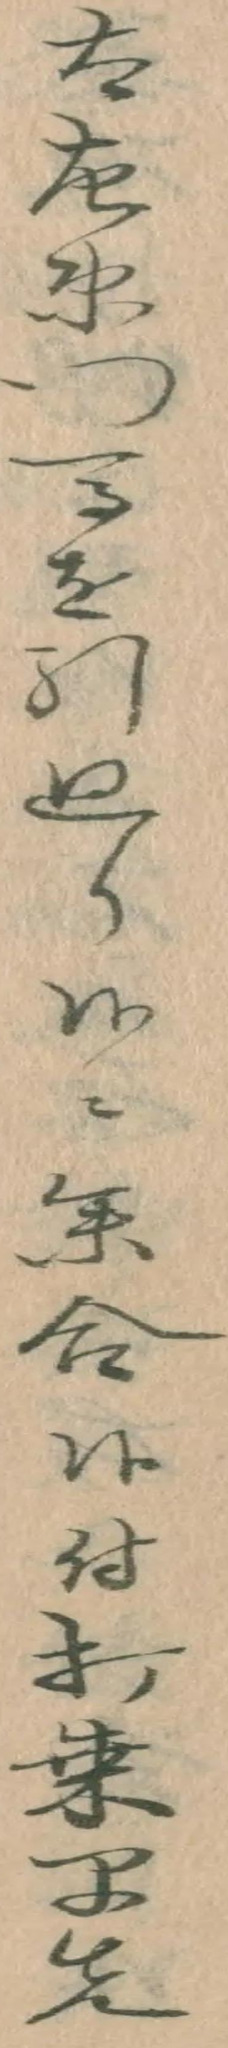太左衛門馬を引廻り候に参合候付打乗早先
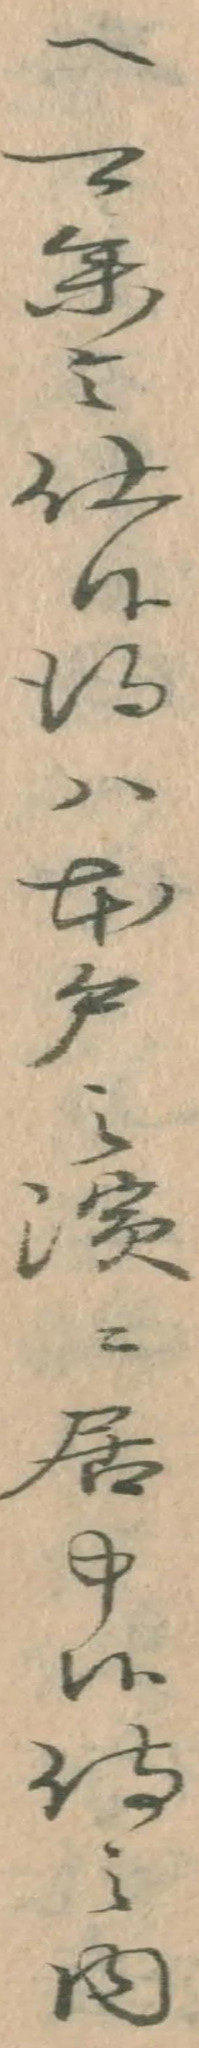へ可参与仕候得は本戸之浜に居申候侍之内
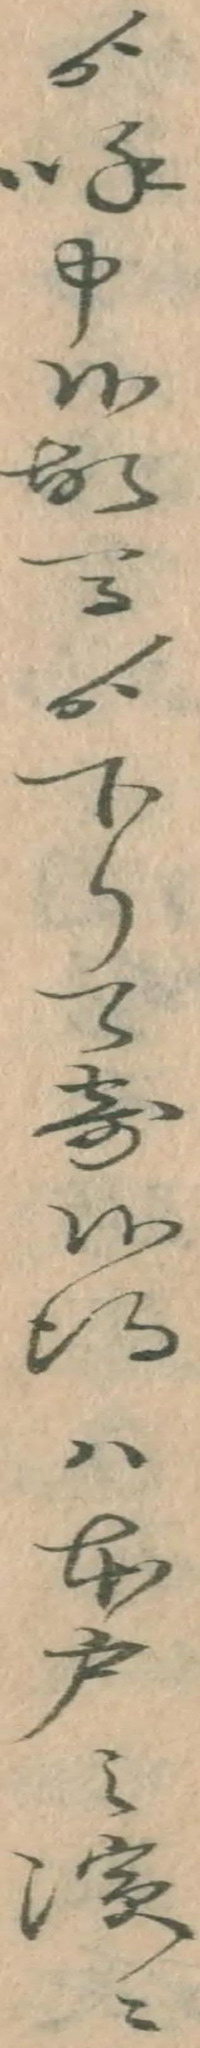ゟ呼申候故馬ゟ下りて寄候得は本戸之浜に

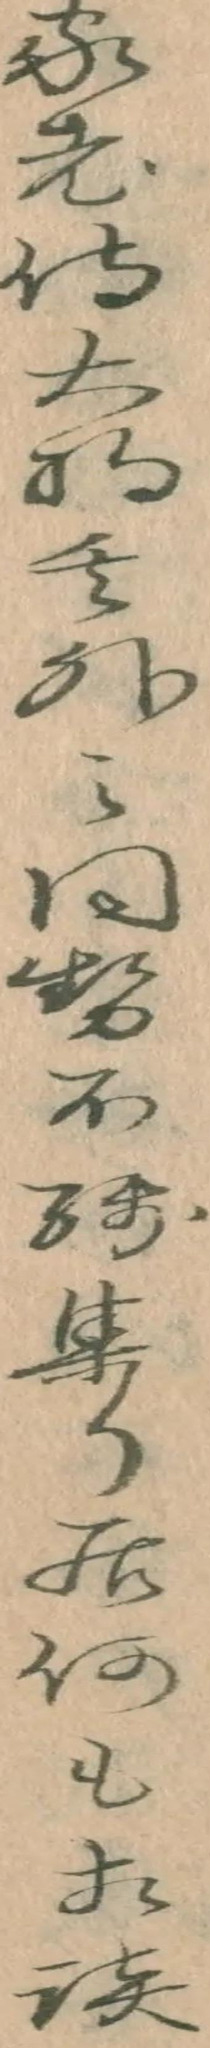家老侍大将其外之同勢不残集り居何も相談
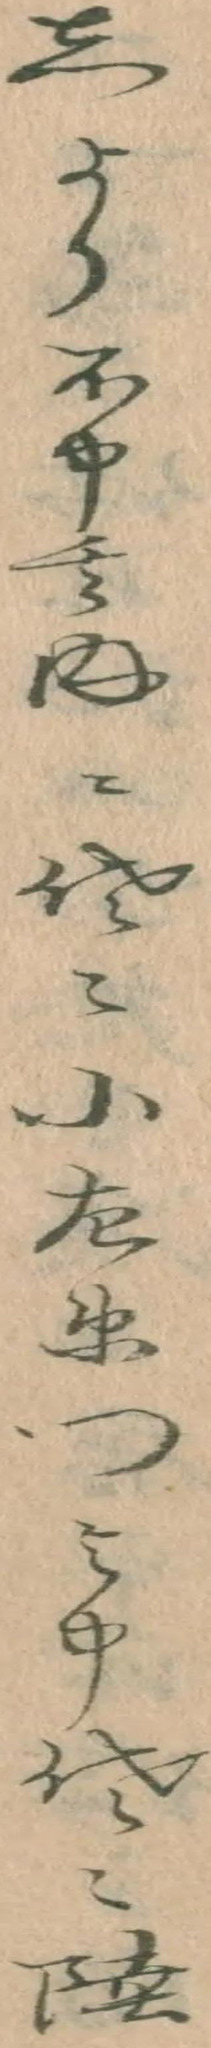志より不申其内に佐々小左衛門与申佐々陸
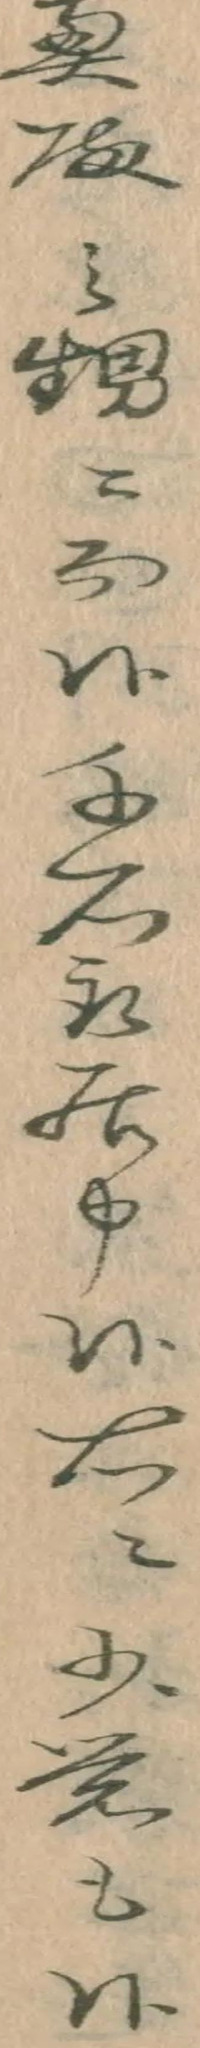奥殿之甥に而候千石取居申候右に少覚も候
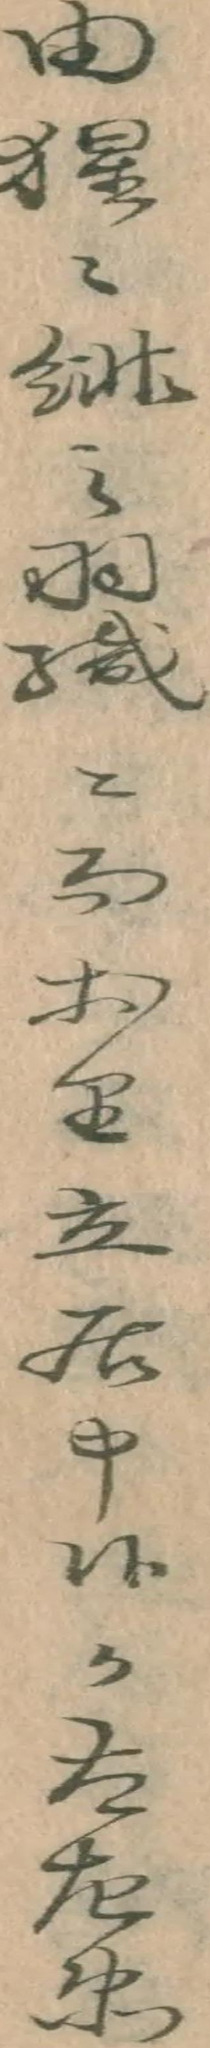由猩に誂之羽織に而お里立居申候か太左衛
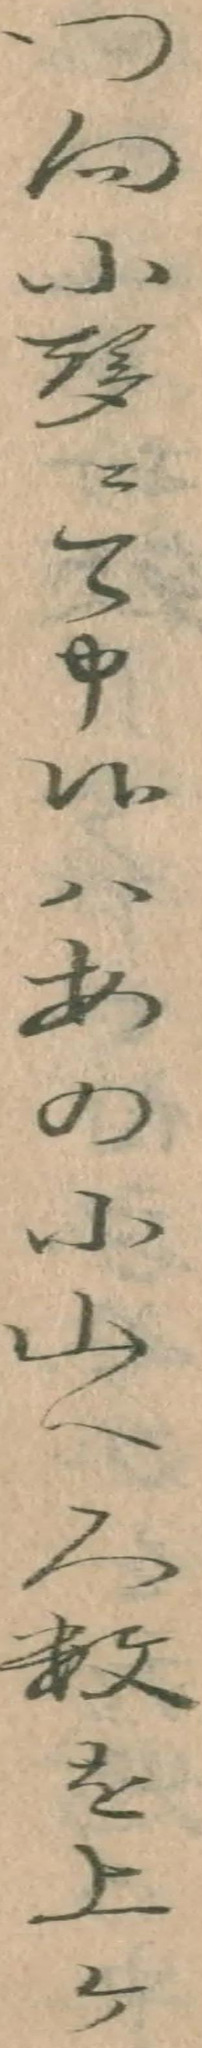門向小声にて申候はあの小山へ人数を上け
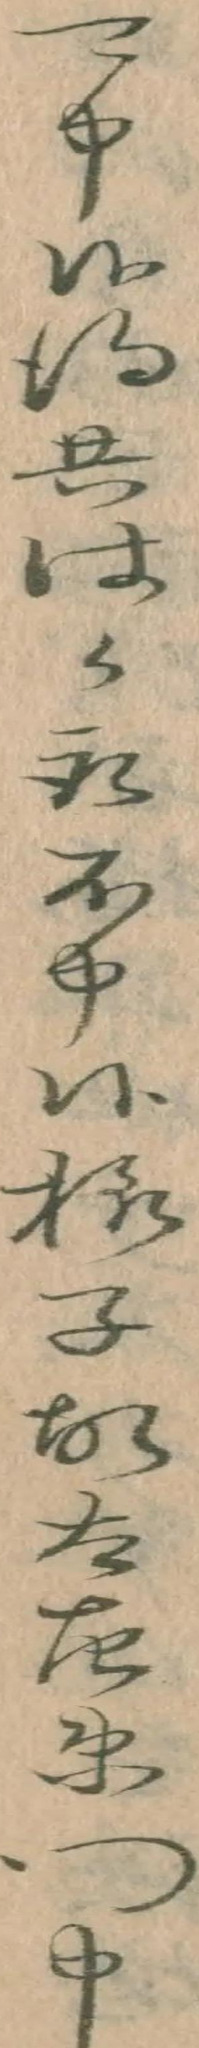可申候得共はか取不申候様子故太左衛門申
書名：切支丹御退治記 49巻. [2]
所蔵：国立国会図書館 National Diet Library, JAPAN
